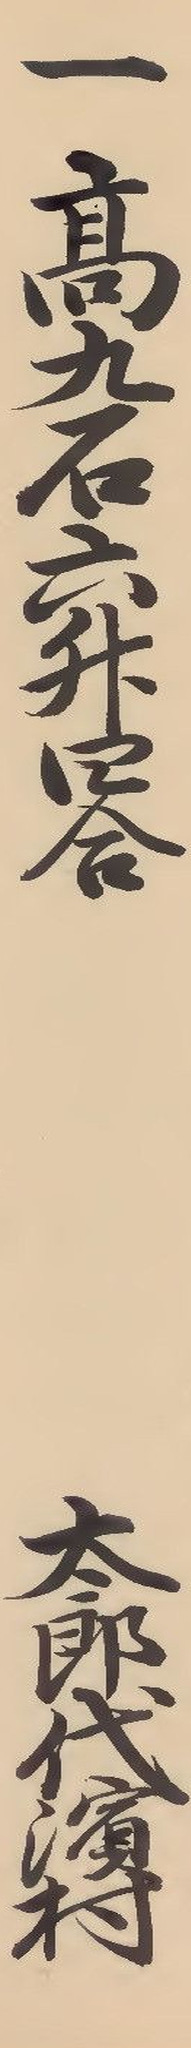一高九石六升四合太郎代浜村
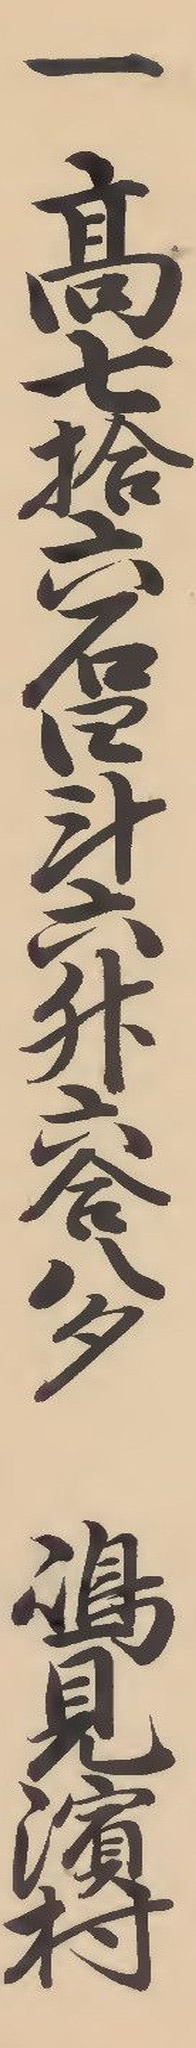一高七拾六石四斗六升六八勺島見浜村

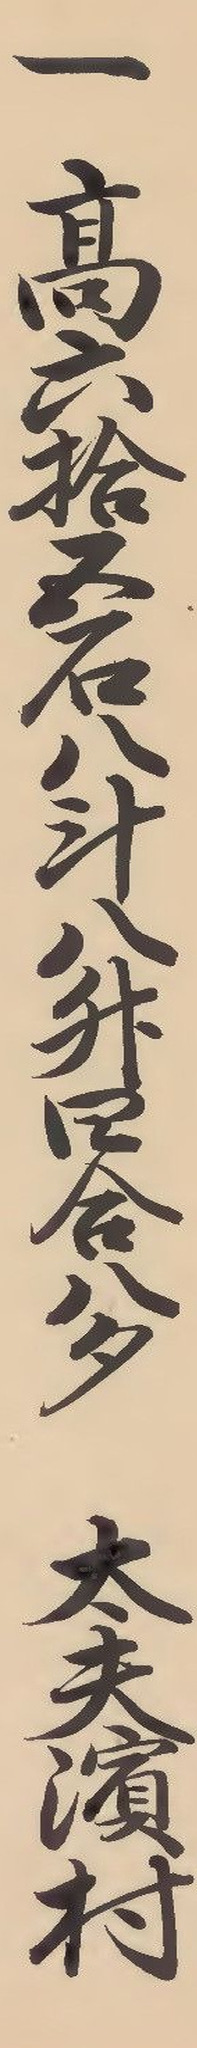一高六拾五石八斗八升四合八勺太夫浜村
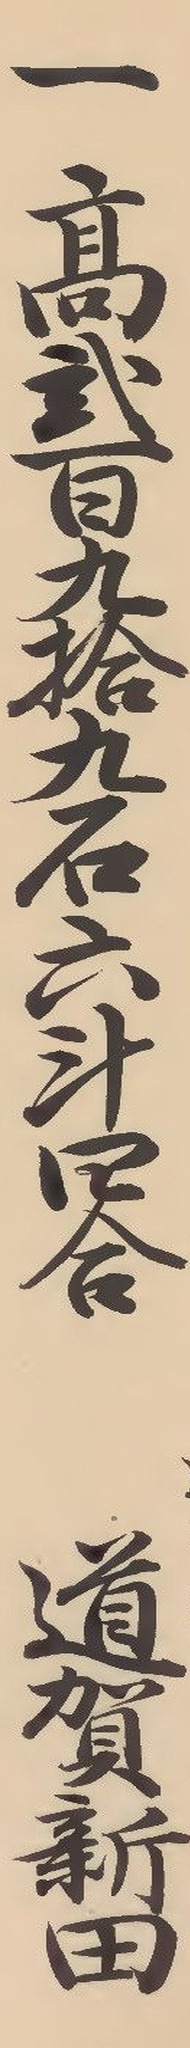一高弐百九拾九石六斗四合道賀新田
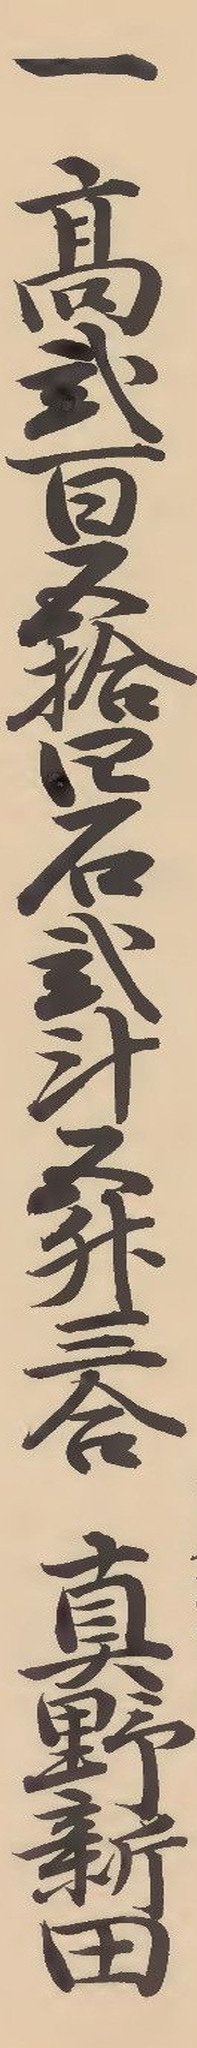一高弐百五拾四石弐斗五升三合真野新田
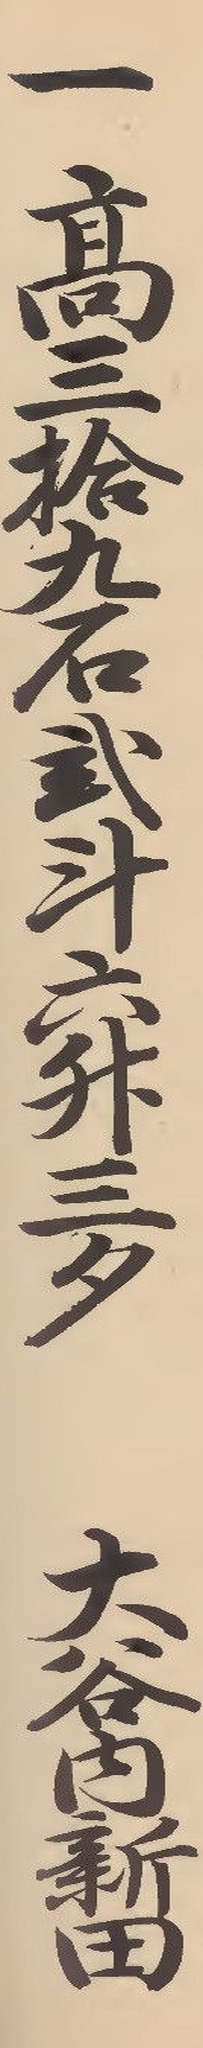一高三拾九石弐斗六升三勺大谷内新田
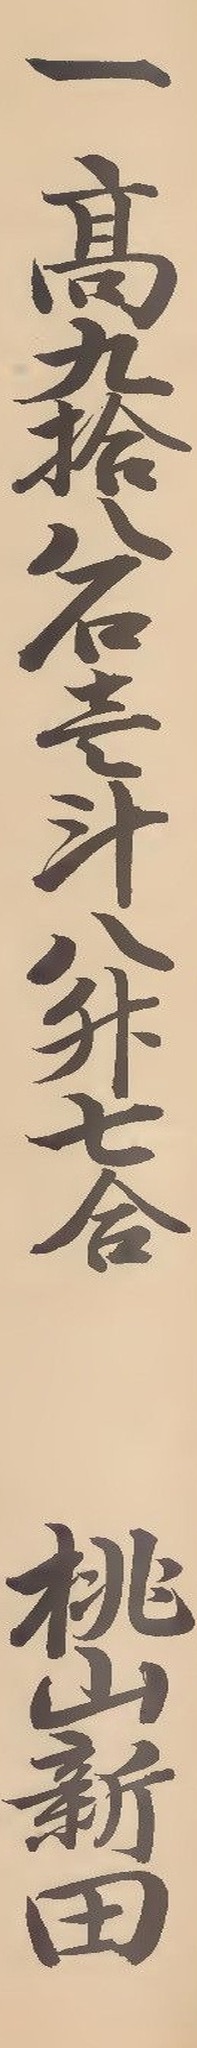一高九拾八石壱斗八升七合桃山新田
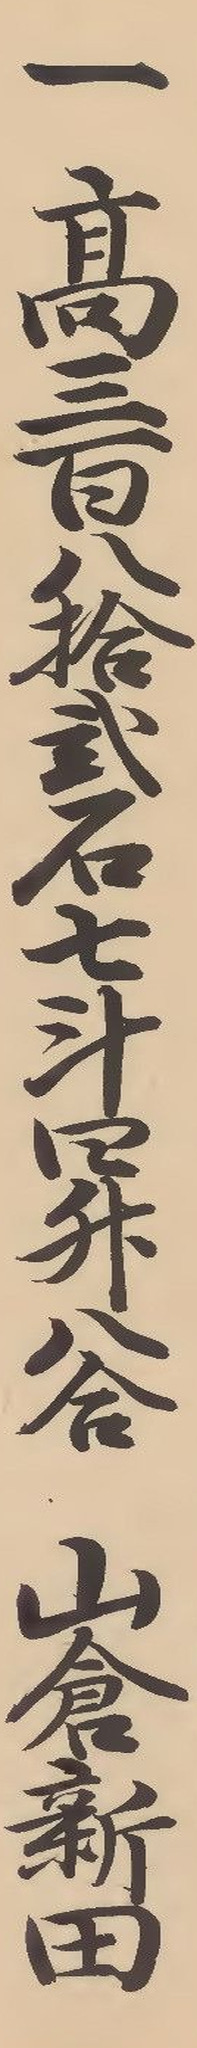一高三百八拾弐石七斗四升八合山倉新田
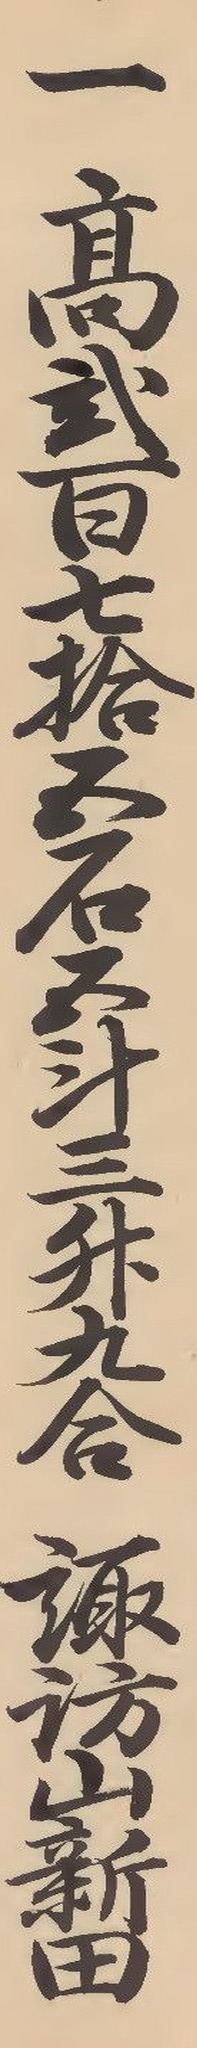一高弐百七拾五石五斗三升九合諏訪山新田
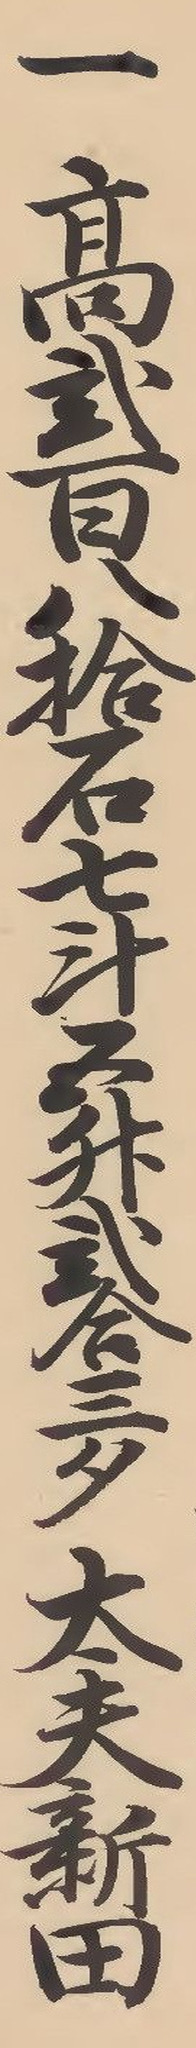一高弐百八拾石七斗五升弐合三勺太夫新田

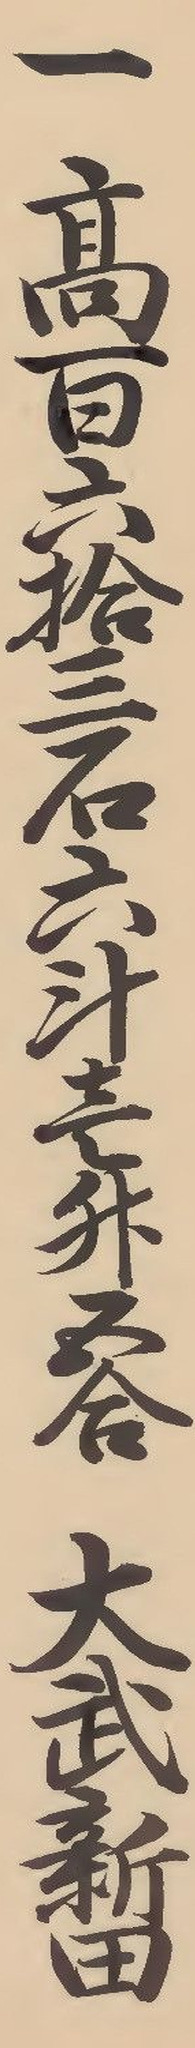一高百六拾三石六斗壱升五合大武新田
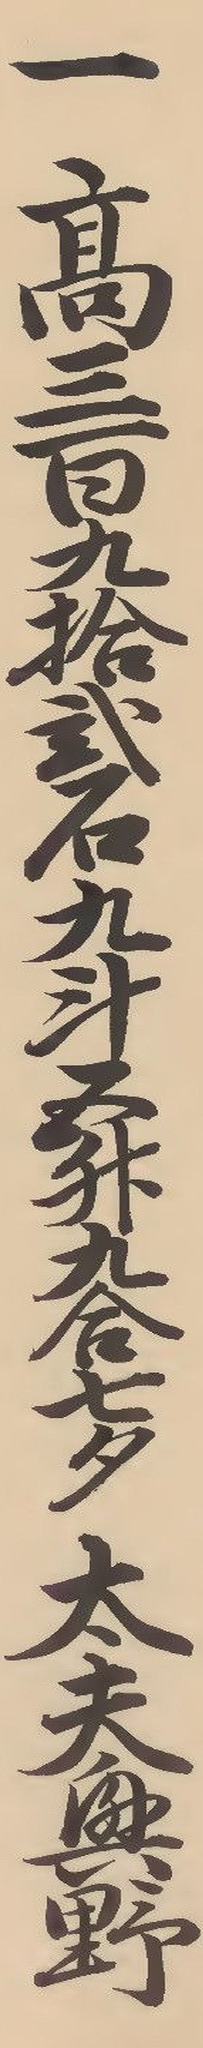一高三百九拾弐石九斗五升九合七勺太夫興野
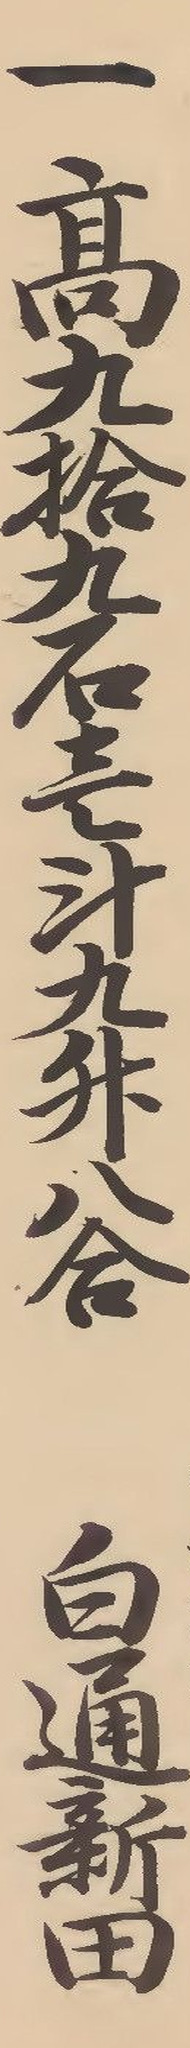一高九拾九石壱斗九升八合白通新田
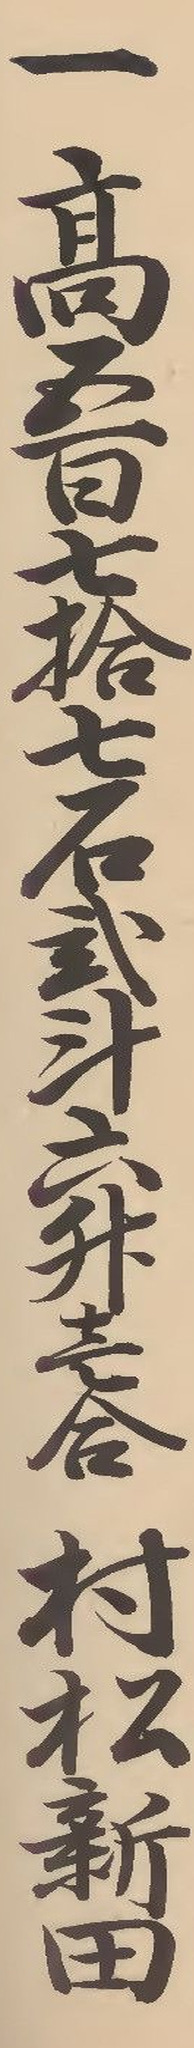一高五百七拾七石弐斗六升壱合村松新田
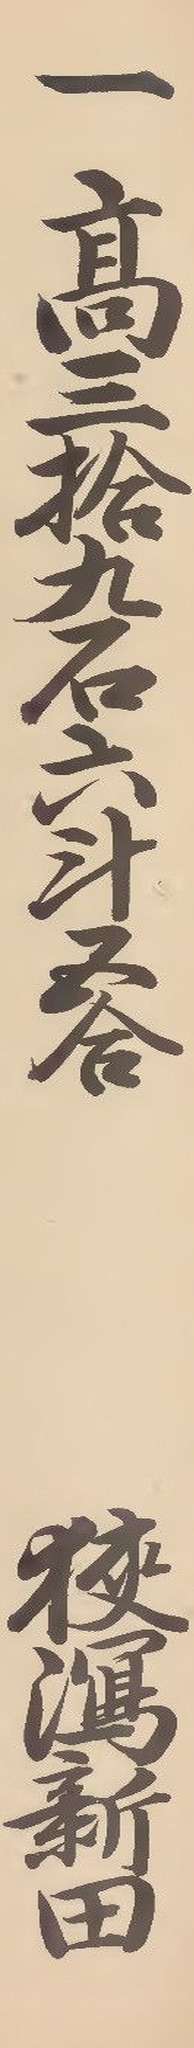一高三拾九石六斗五合狭潟新田
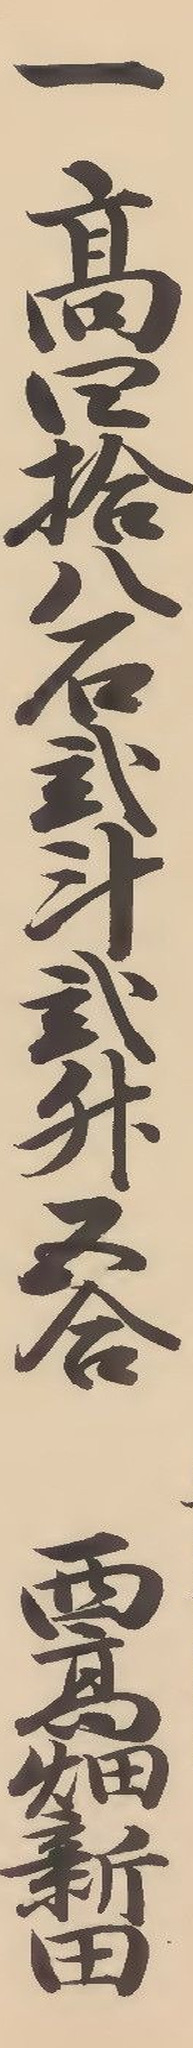一高四拾八石弐斗弐升五合西高畑新田
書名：越後国郷帳　下
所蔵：国立公文書館 National Archives of Japan
